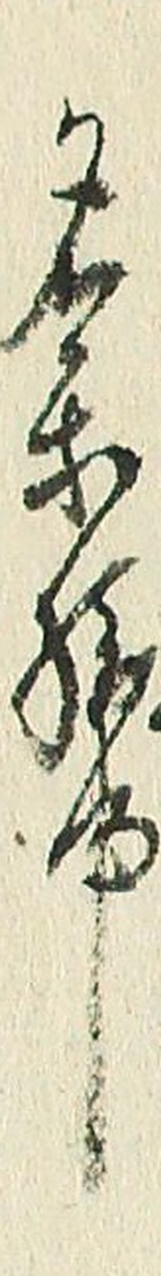名東勝浦

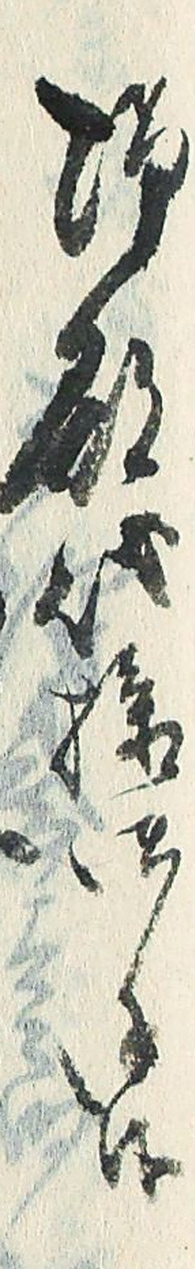御郡代様御手代
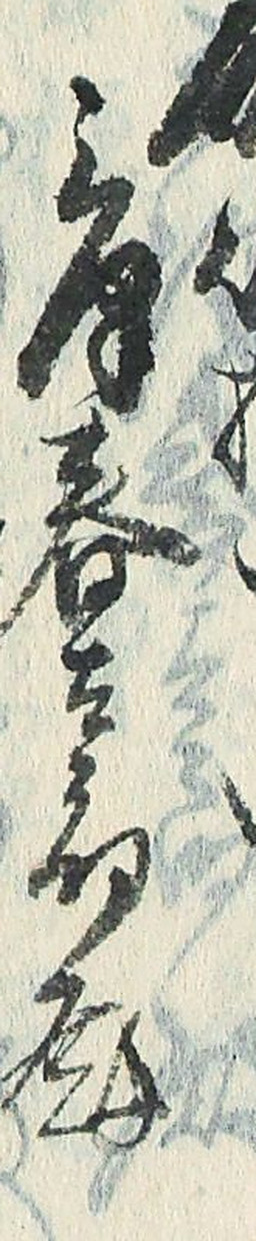三沢春太郎殿
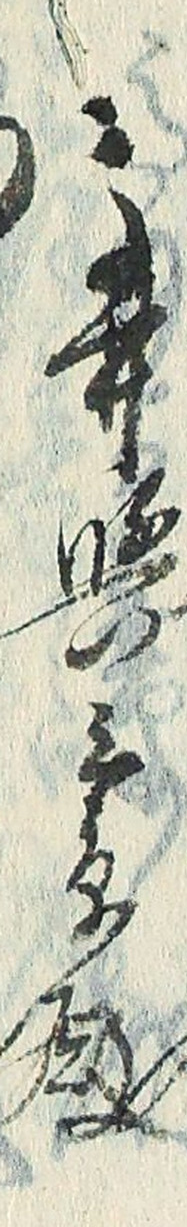高井与三兵衛殿
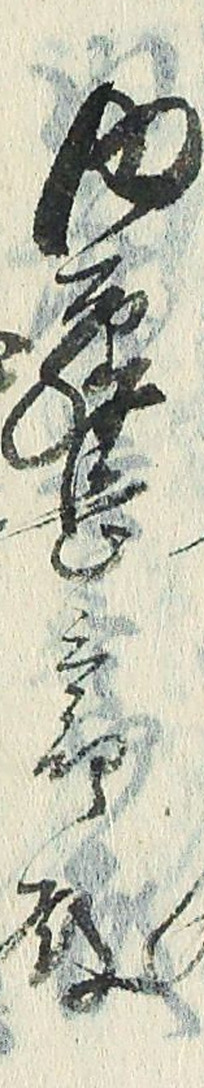内藤長三郎殿
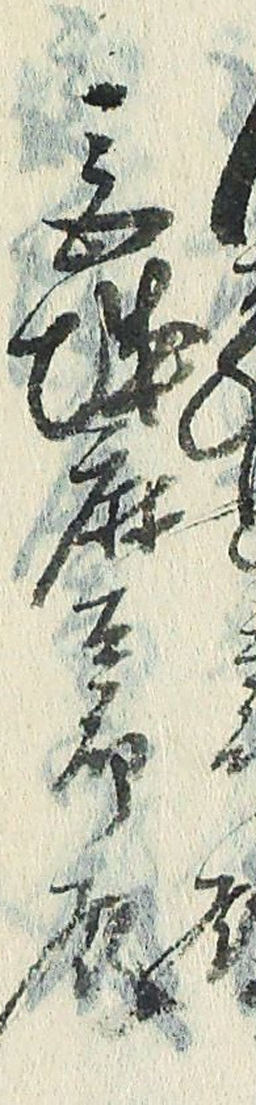宮城麻太郎殿
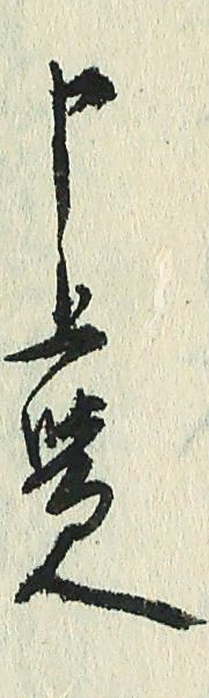申上覚
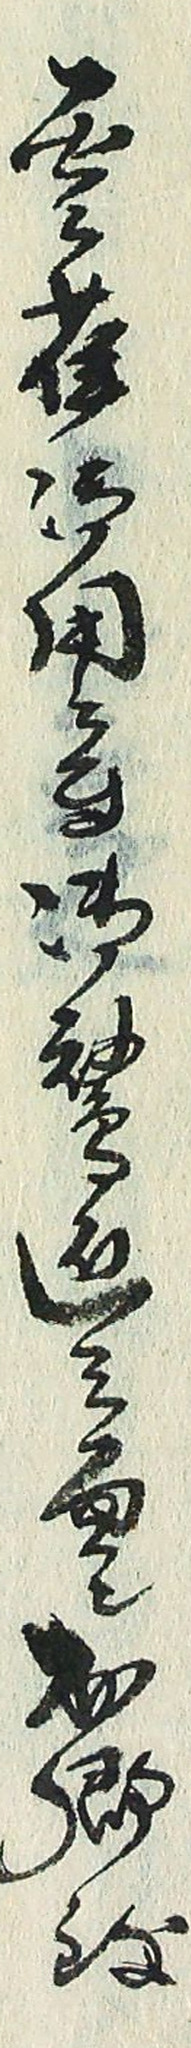雲雀御用に付御鷹匠之面々出郷致
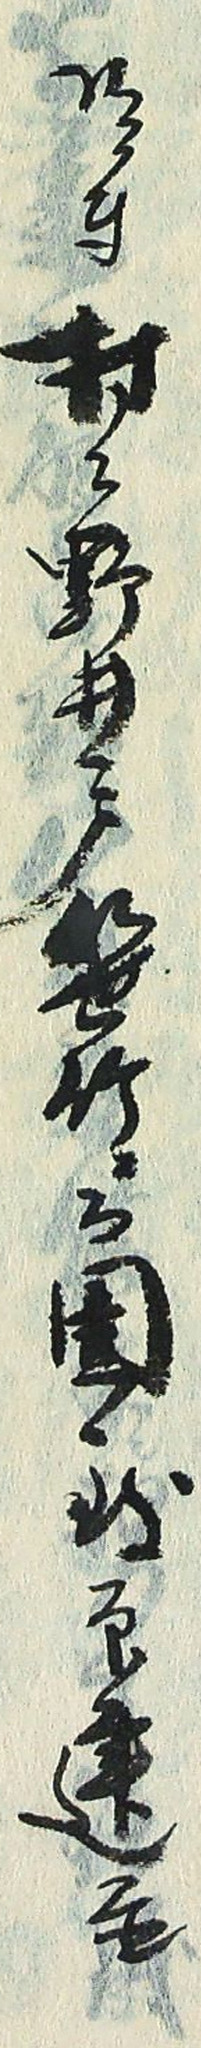候に付村々野井戸笹竹に而囲致印建置
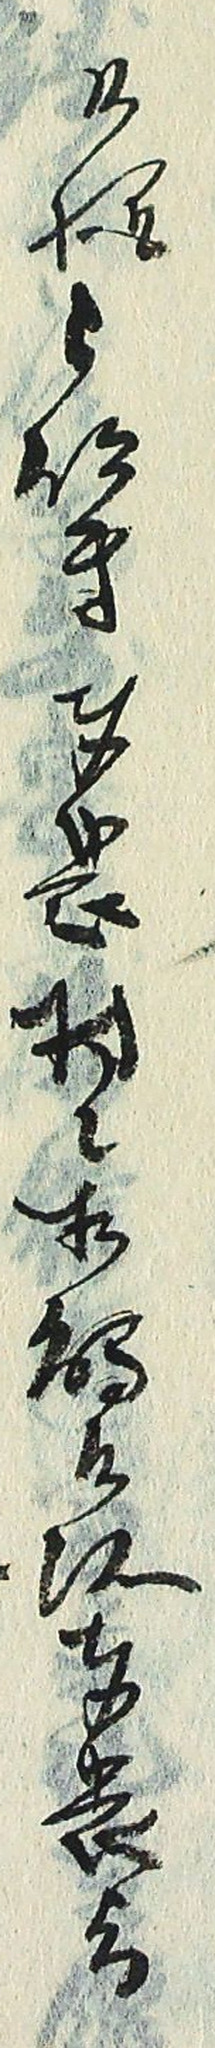候様被仰付奉畏村々相触候所奉畏旨
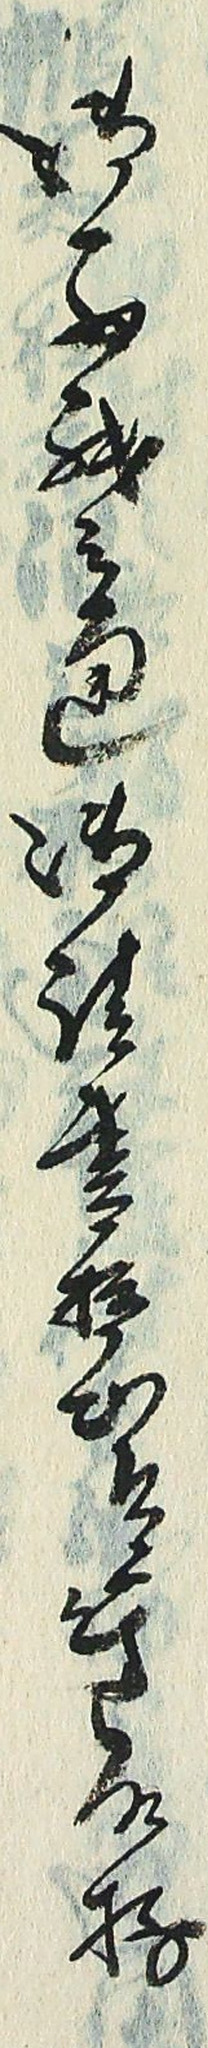御別紙之通御請書指出候に付取揃
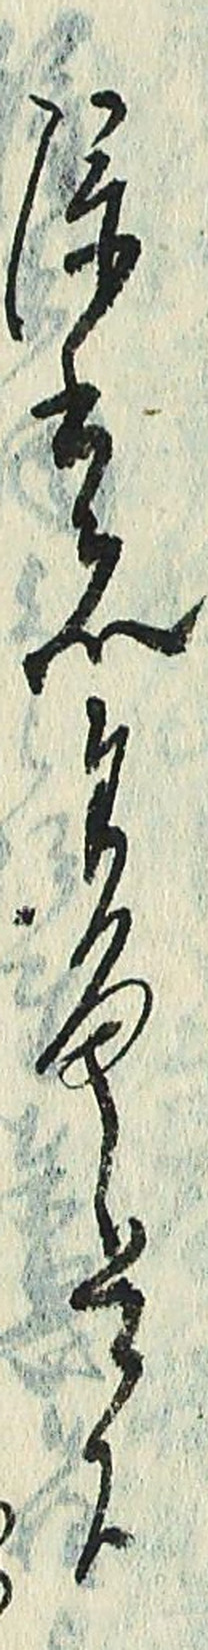添書を以奉差上候以上
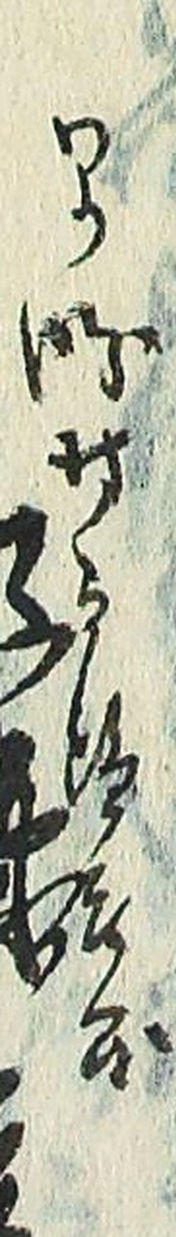早淵村与頭庄屋
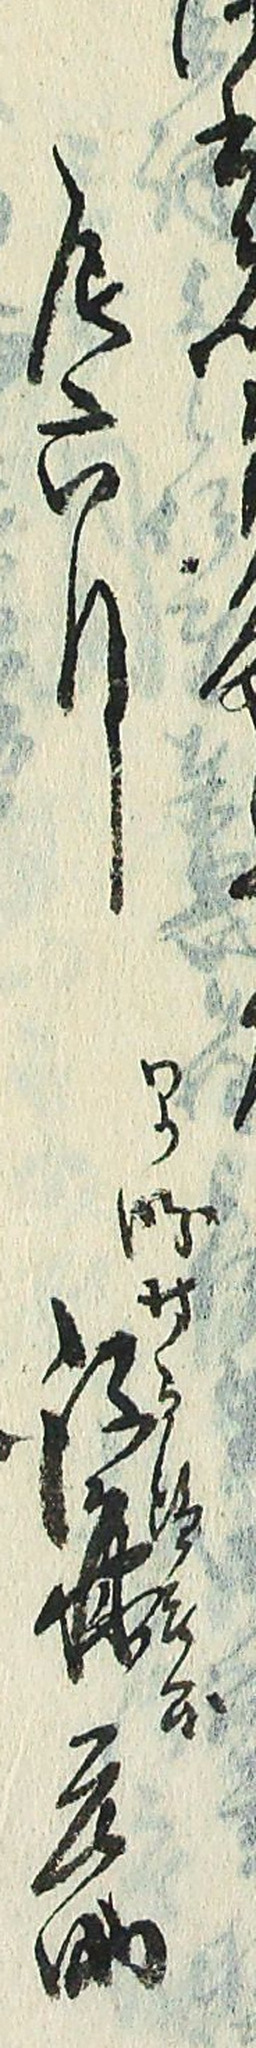辰六月後藤庄助
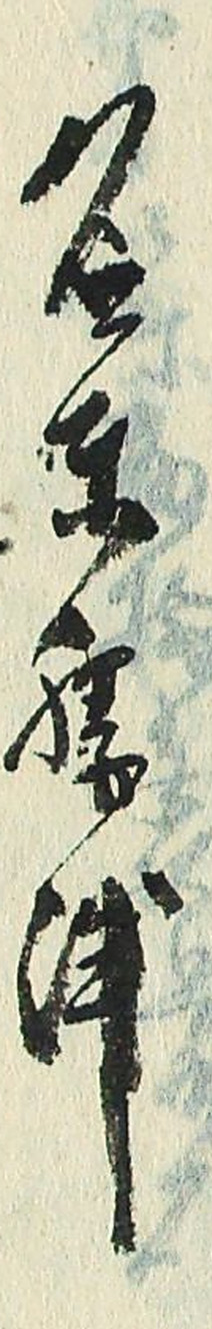名東勝浦
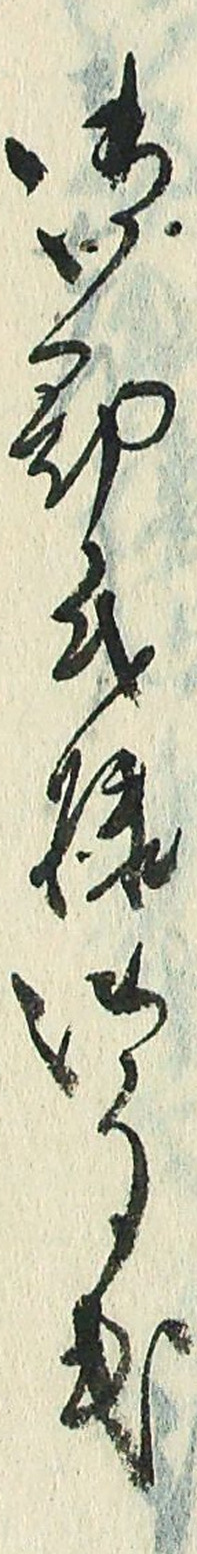御郡代様御手代
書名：諸御用御□受書控
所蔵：鳴門教育大学 Naruto University of Education
